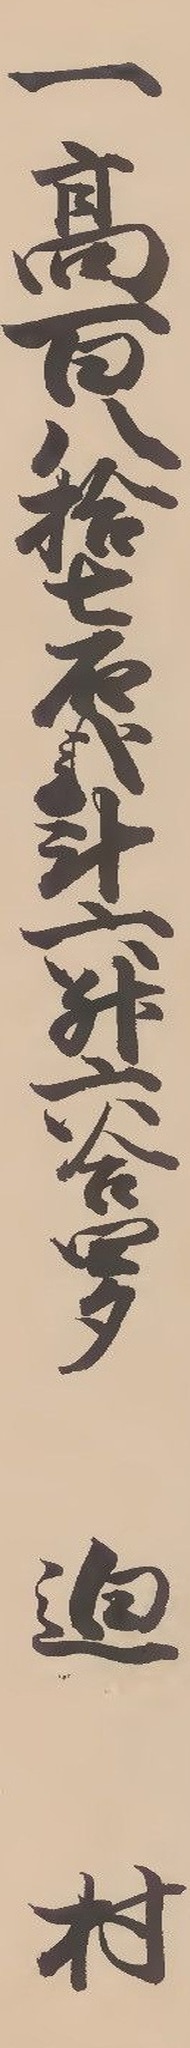一高百八拾七石弐斗六升六合四勺迫村
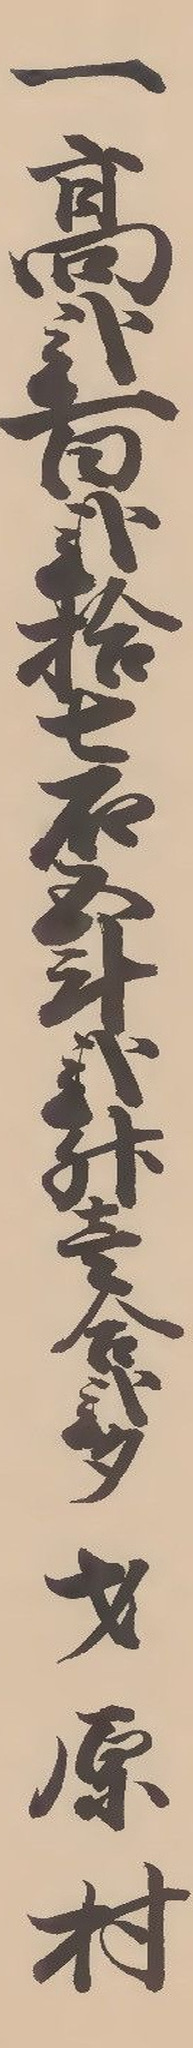一高弐百弐拾七石五斗弐升壱合弐勺才原村
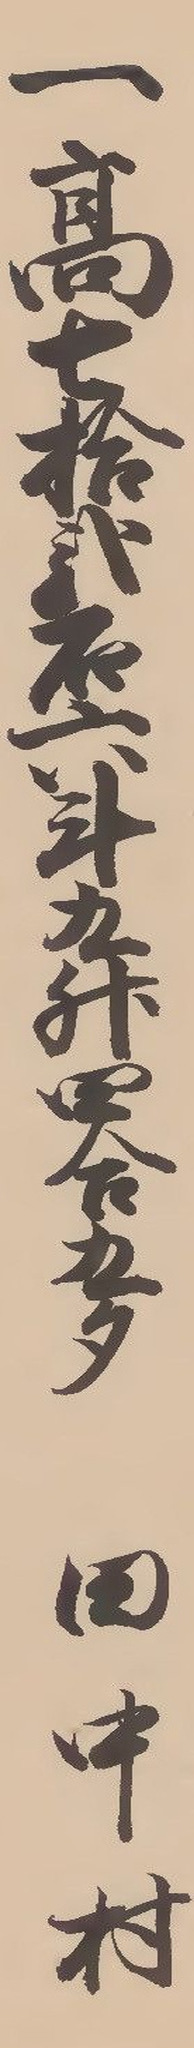一高七拾弐石六斗九升四合九勺田中村
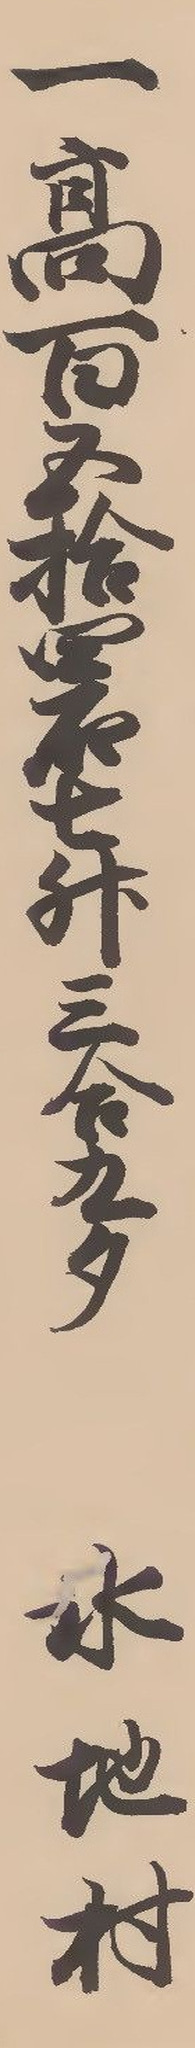一高百五拾四石七升三合九勺水地村

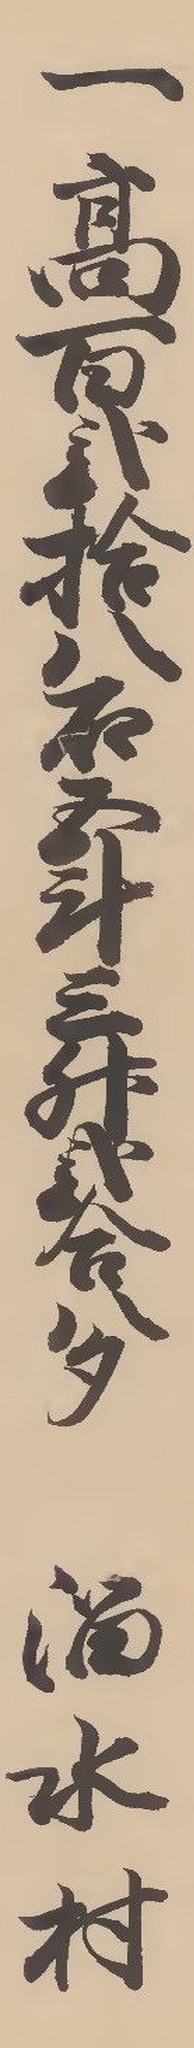一高百弐拾八石五斗三升弐合八勺溜水村
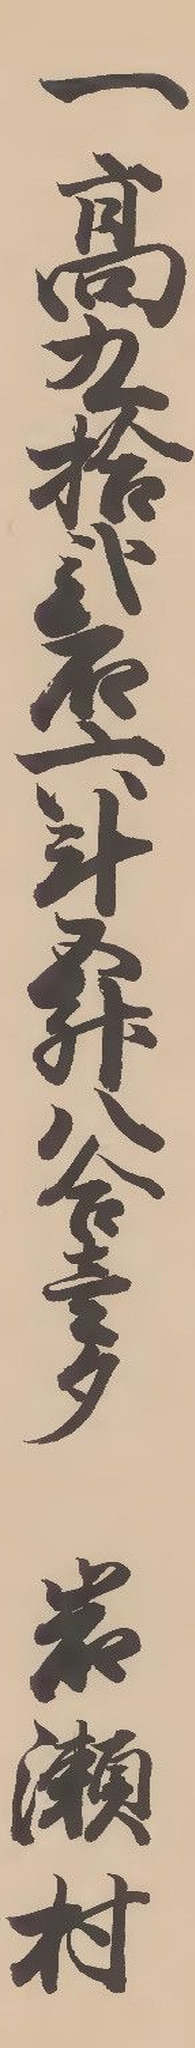一高九拾弐石六斗五升八合壱勺岩瀬村
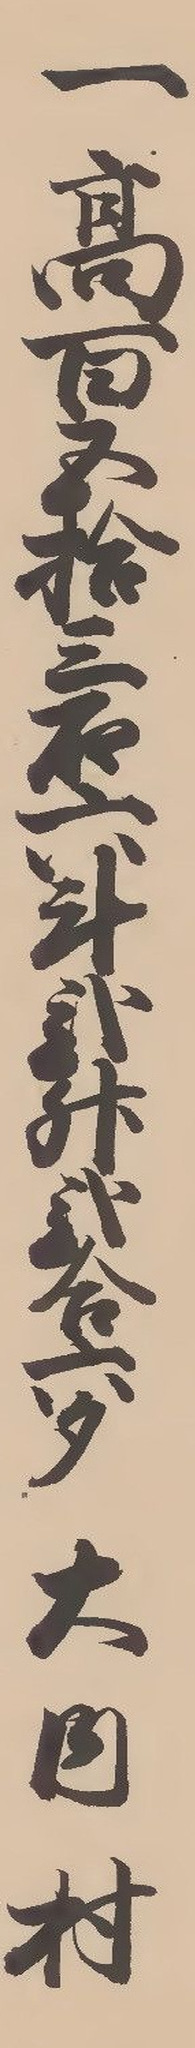一高百五拾三石六斗弐升弐合六勺大内村
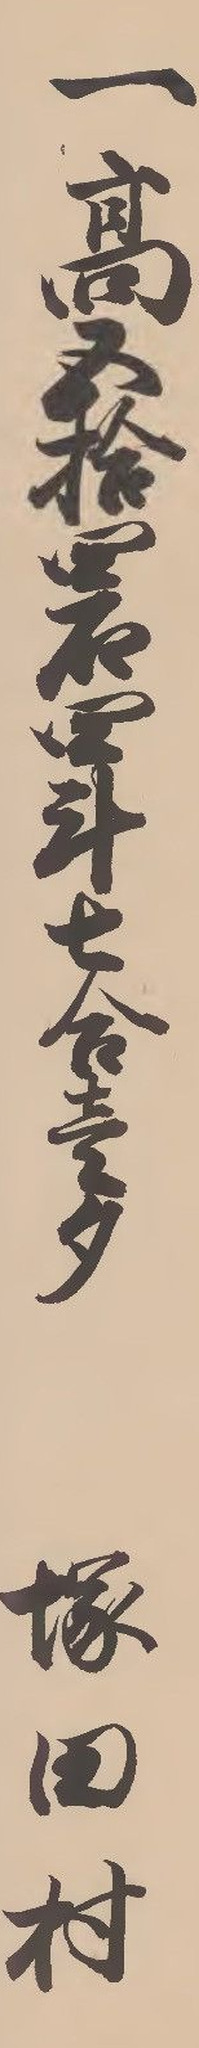一高五拾四石四斗七合壱勺塚田村
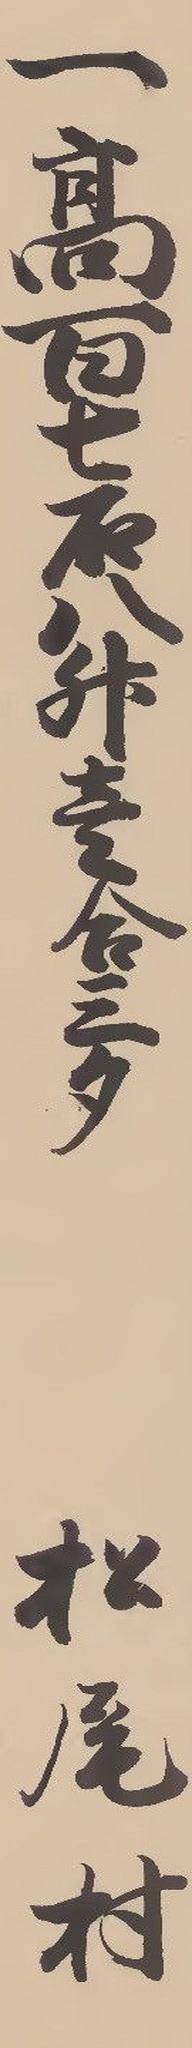一高百七石八升壱合三勺松尾村
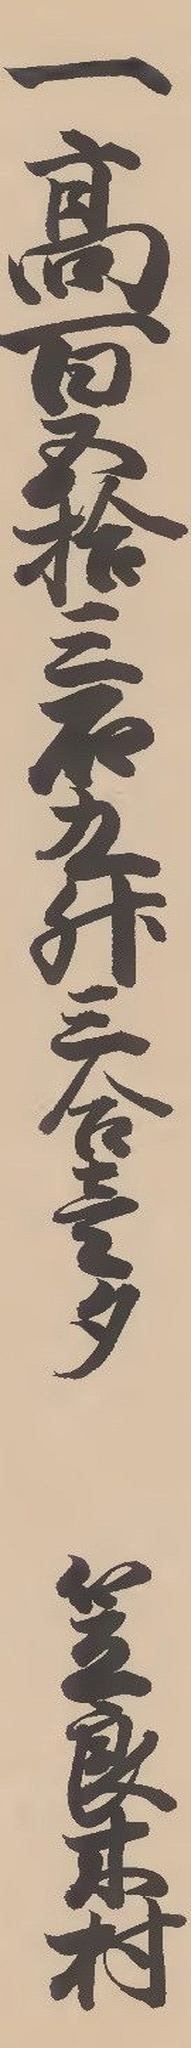一高百五拾三石九升三合壱勺笠良木村
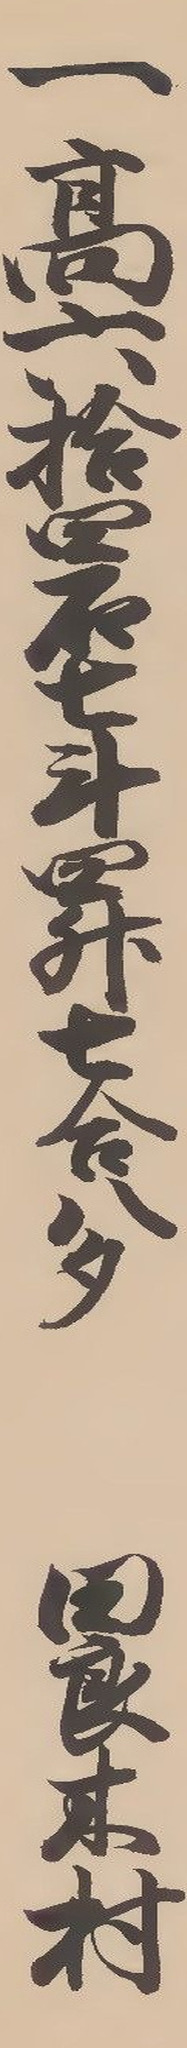一高六拾四石七斗四升七合八勺田良木村
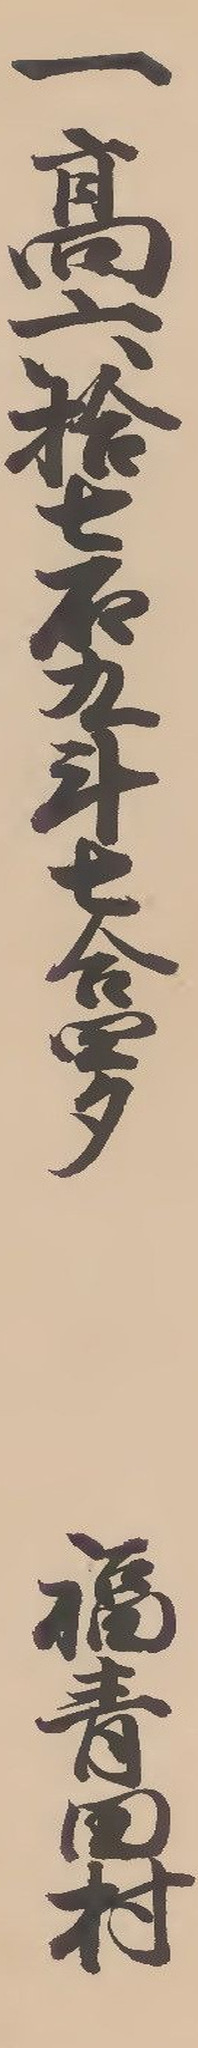一高六拾七石九斗七合四勺福青田村

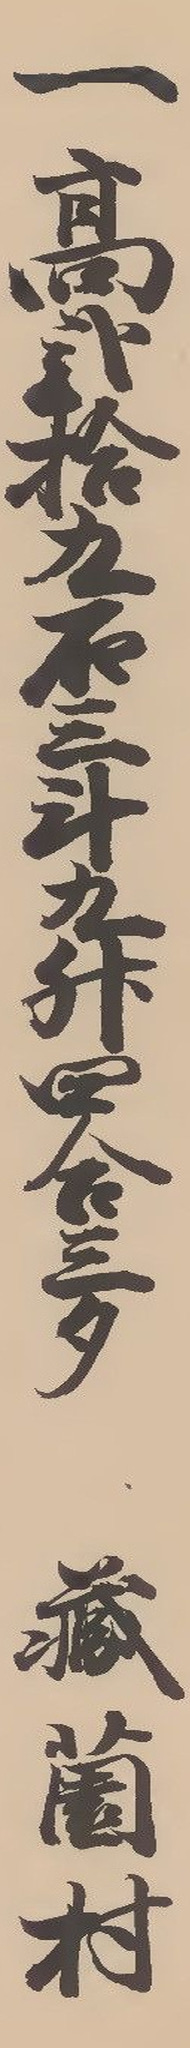一高弐拾九石三斗九升四合三勺蔵薗村
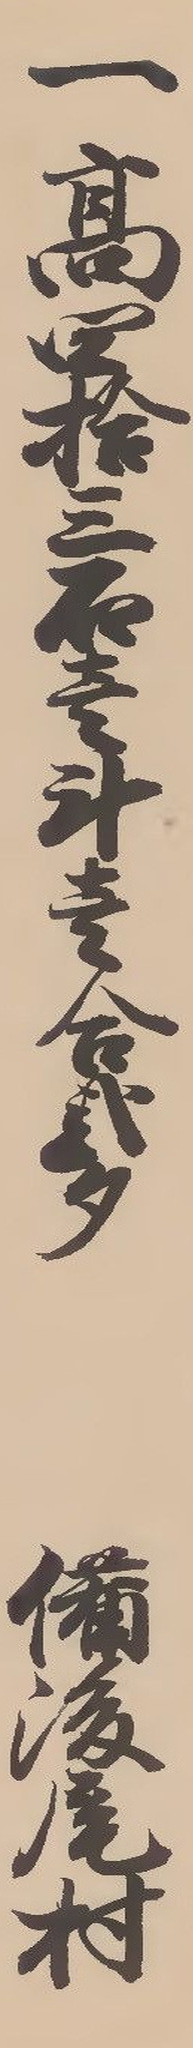一高四拾三石壱斗壱合弐勺備後尾村
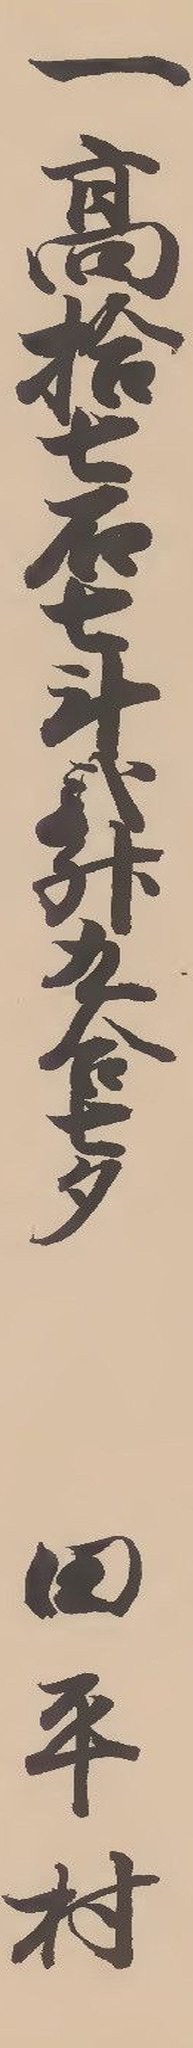一高拾七石七斗弐升九合七勺田平村
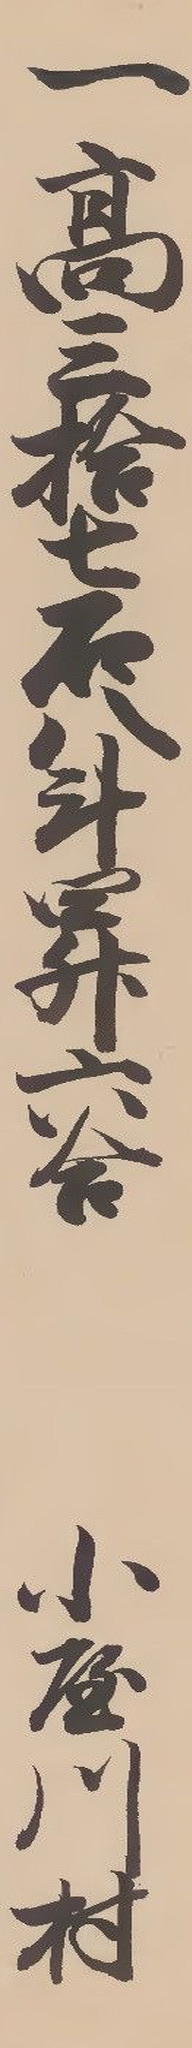一高三拾七石八斗四升六合小屋川村
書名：豊後国郷帳
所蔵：国立公文書館 National Archives of Japan
